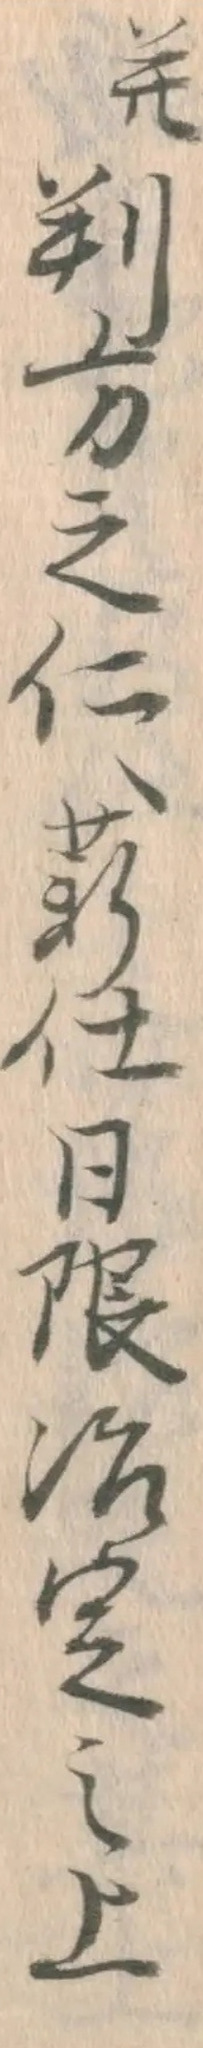并判方之仁へ薪仕日限治定之上
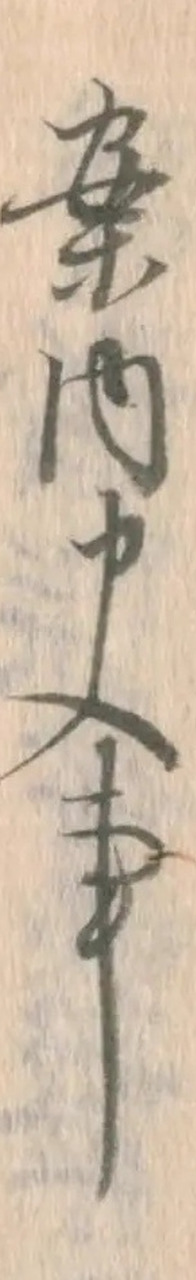案内申入事
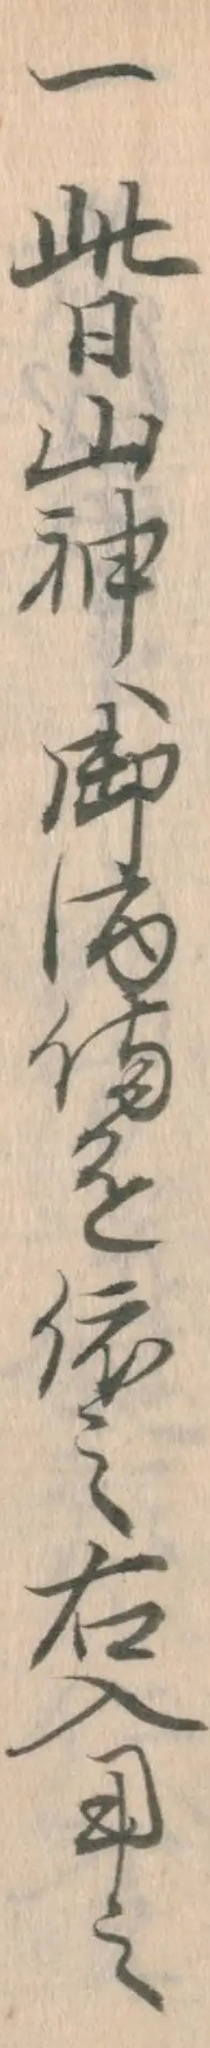一此日山神へ御酒備懸依之右入用之
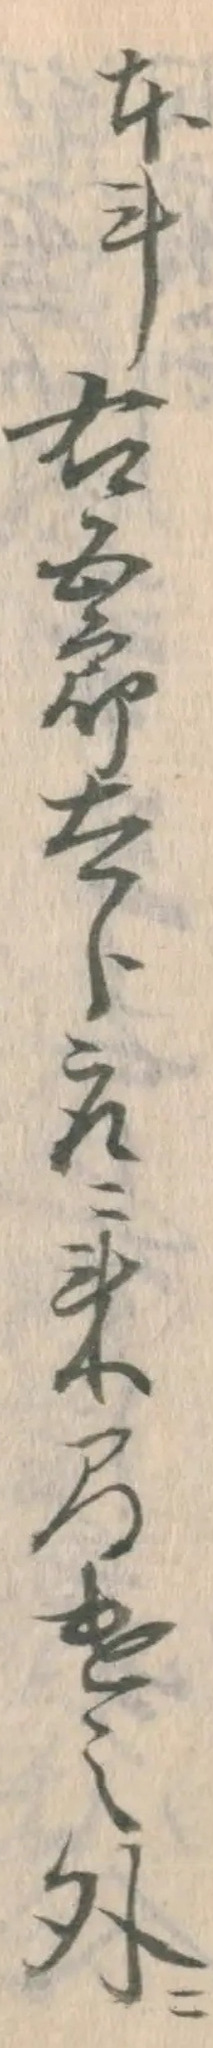本斗右五郎太郎取ニ来間遣之外に
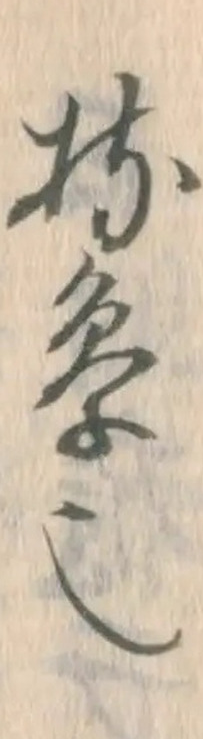持参也
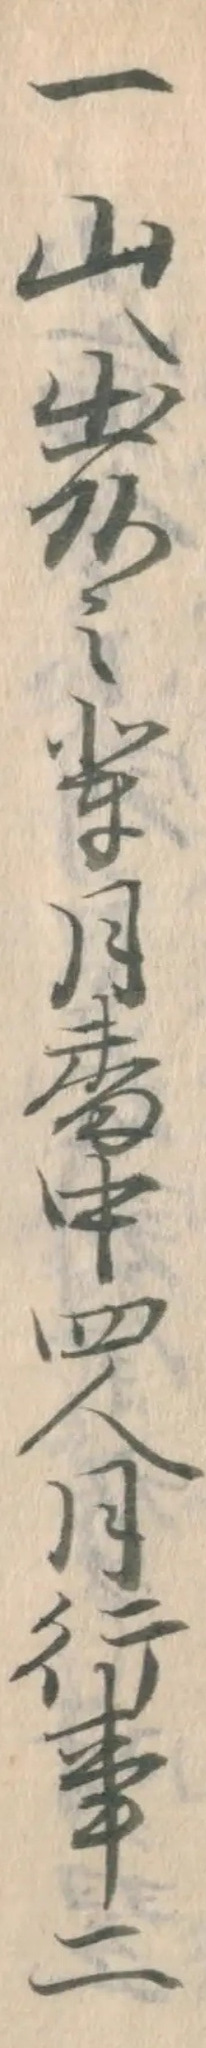一山へ出頭之輩月番中四人月行事二

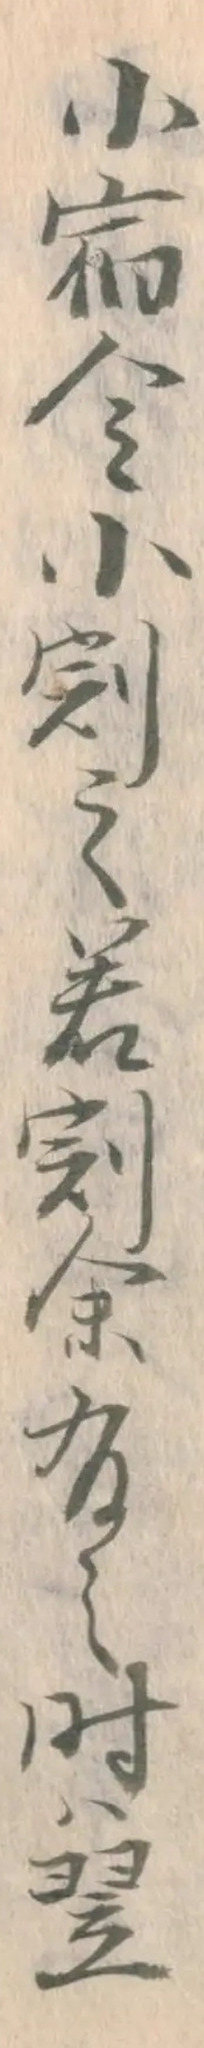小宿令小割之若割余有之時は翌
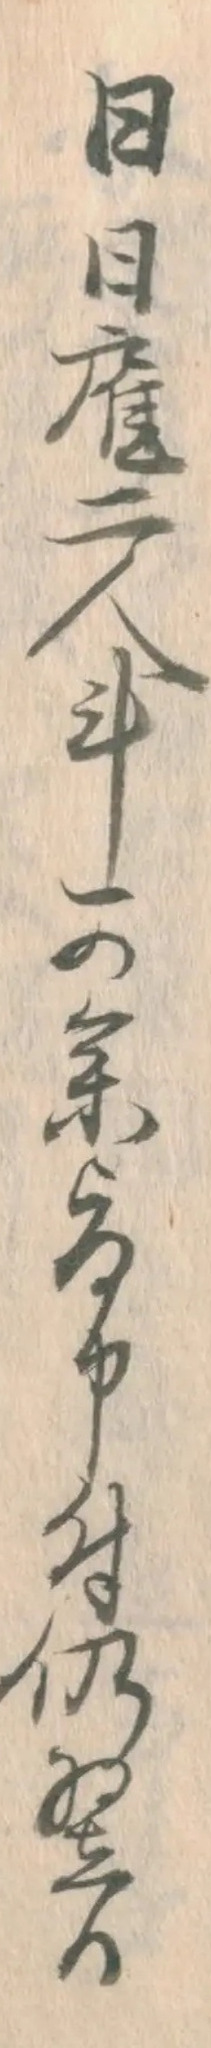日日雇二人斗可参旨申付仍翌日
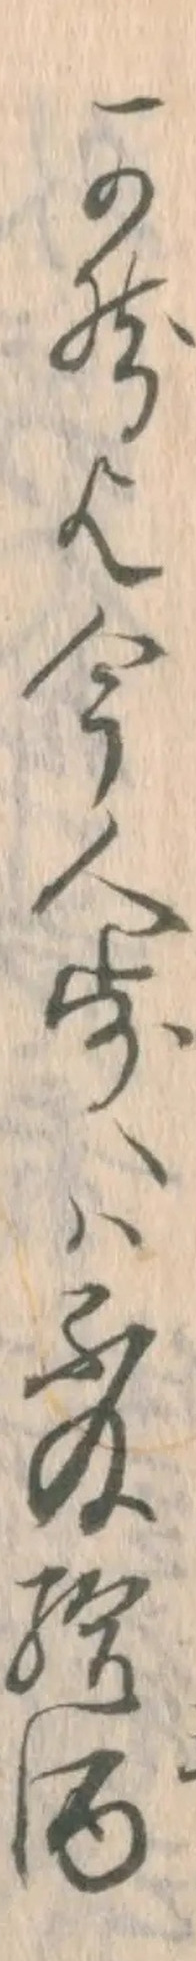可然歟今人歩へは不及給酒
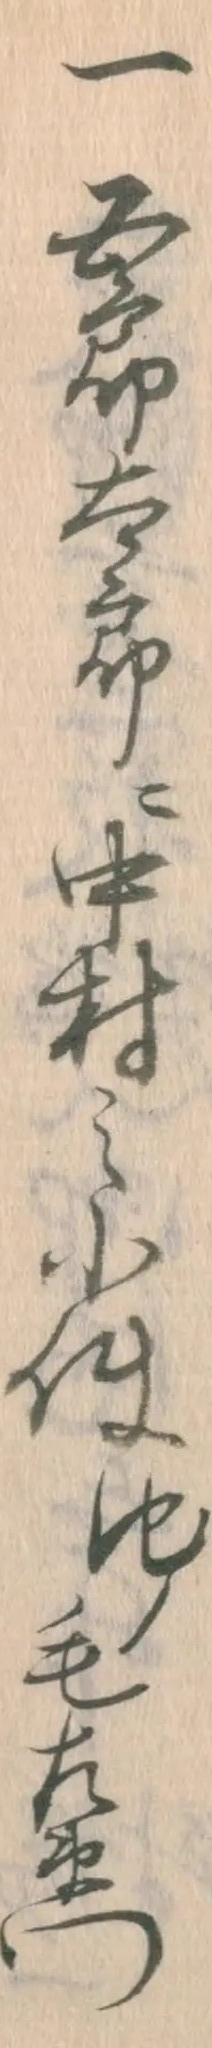一五郎太郎に中村之小使池ノ毛左衛門
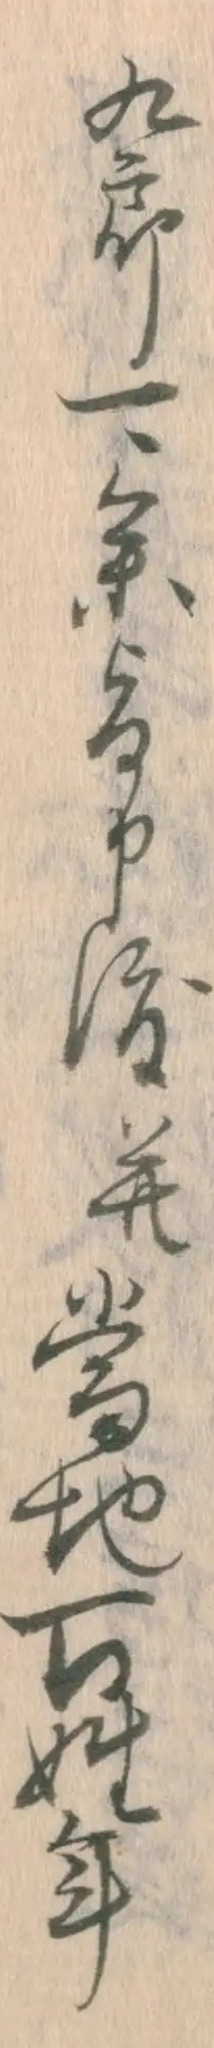九郎可参旨申渡并当地百姓年
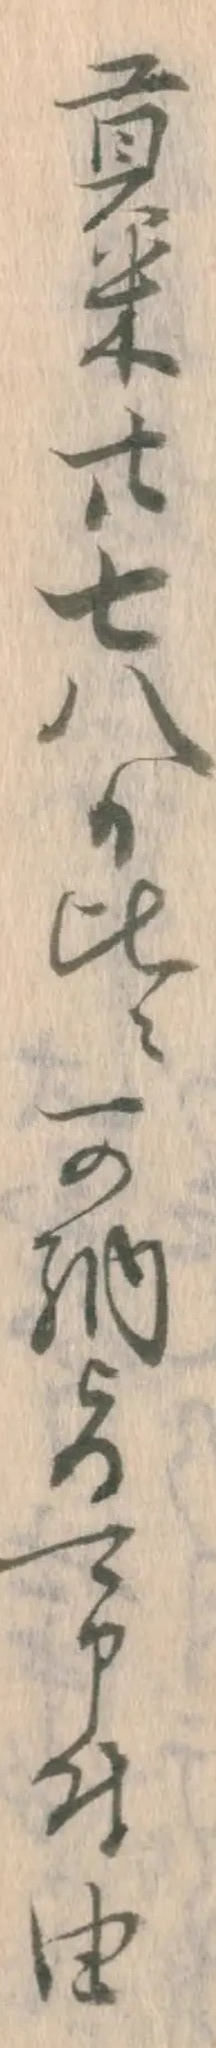貢米廿七八日比に可納旨可申付由
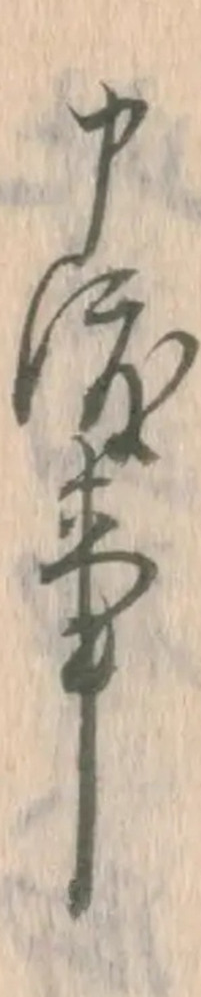申渡事
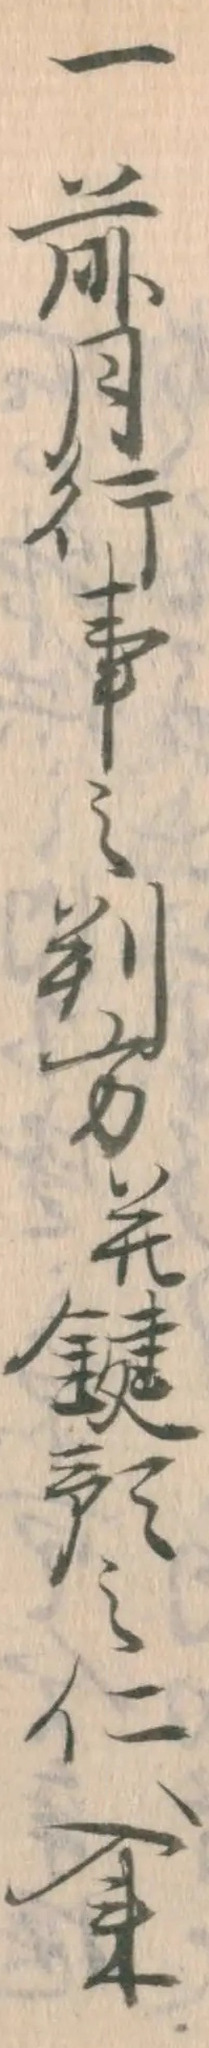一前月行事之判方并鍵預之仁へ入来
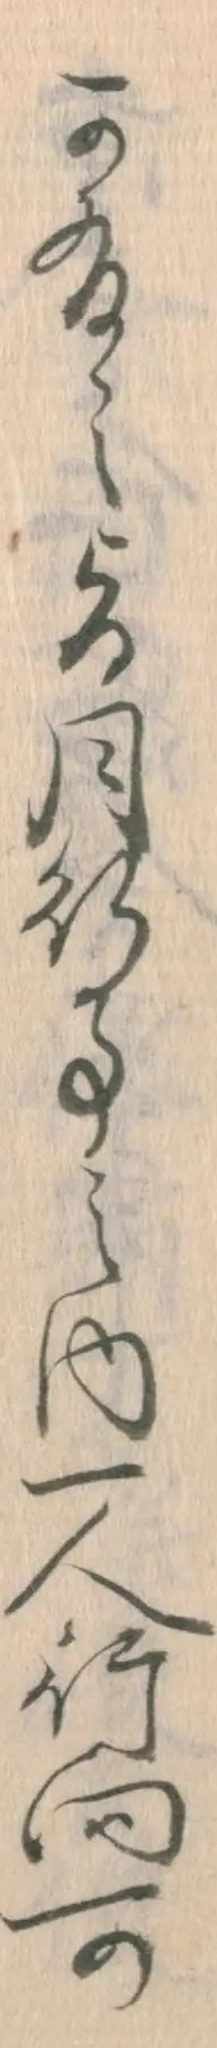可有之旨月行事之内一人行向可
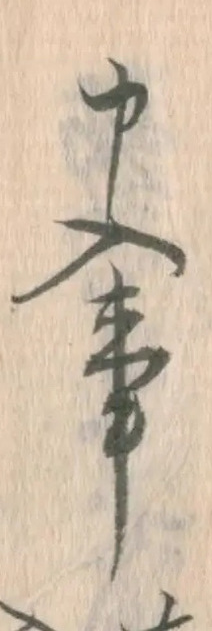申渡事
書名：賀茂社記録. 第81冊
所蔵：国立国会図書館 National Diet Library, JAPAN
